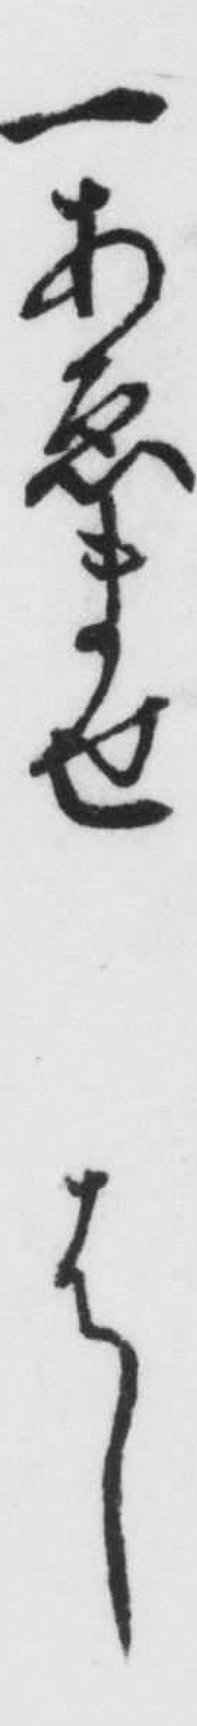一あゑませはし
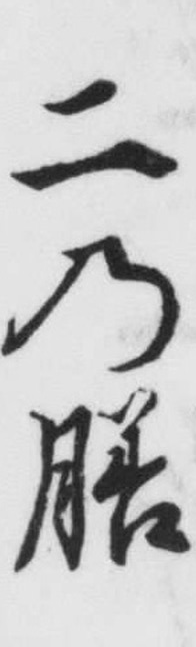二の膳
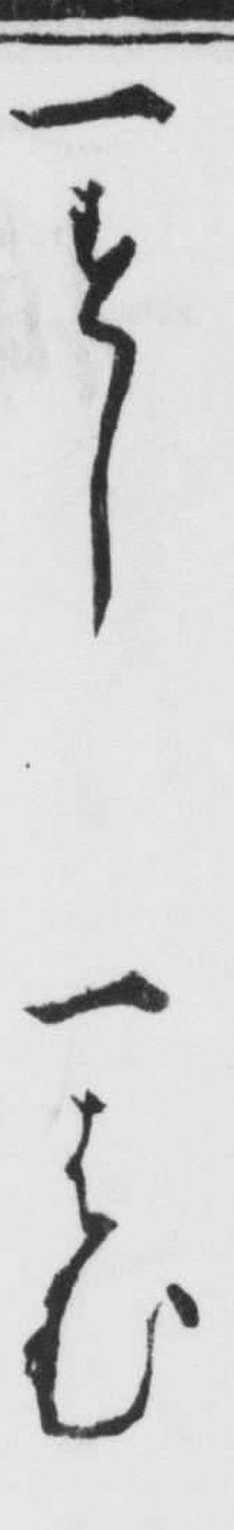一すし一はむ
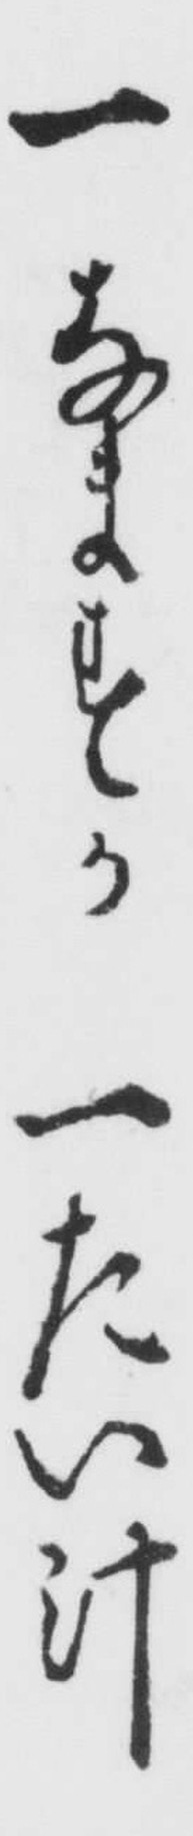一なますか一たい汁
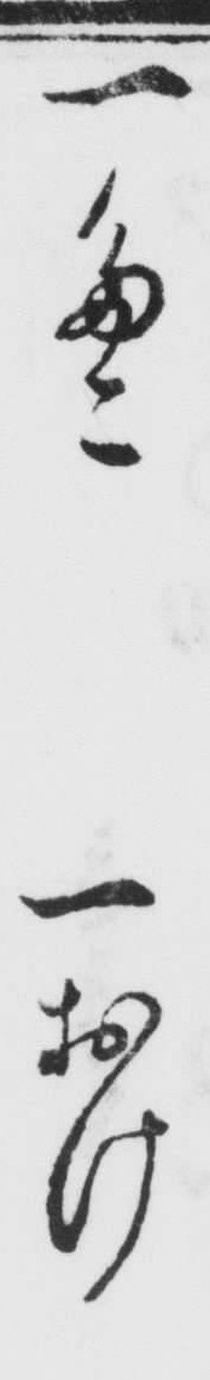一ゆこ一おけ
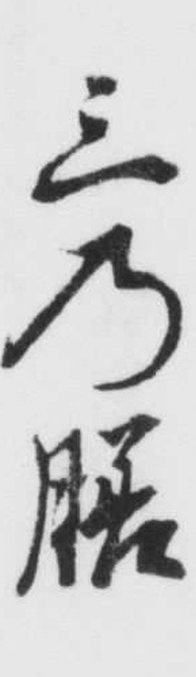三の膳
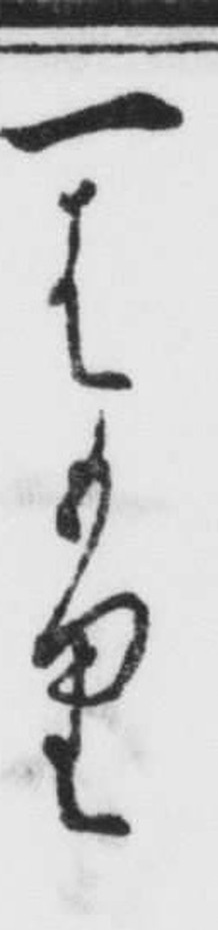一はもり
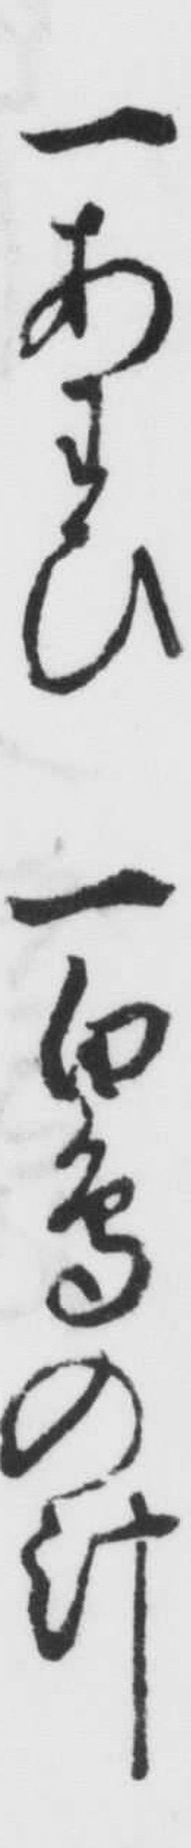一あわひ一白鳥の汁
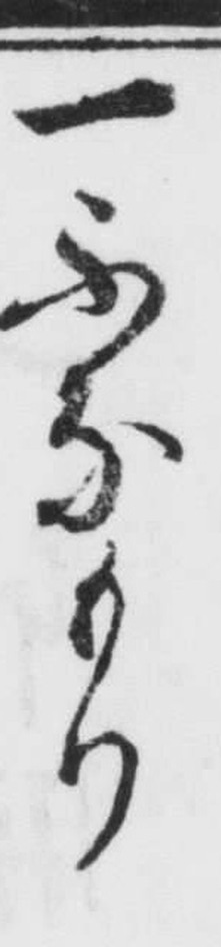一ふかもり
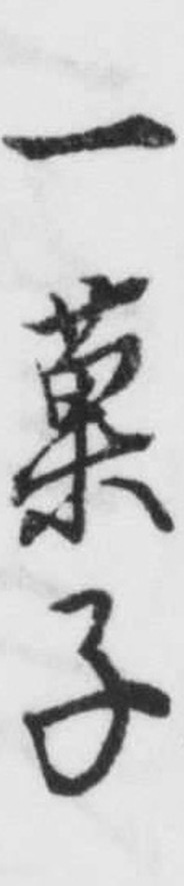一菓子

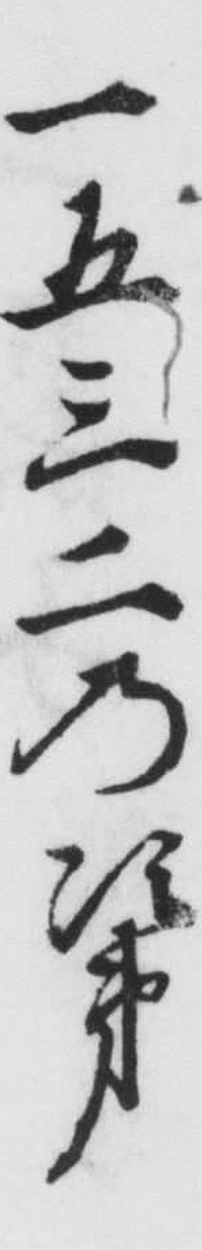一五三二乃次第
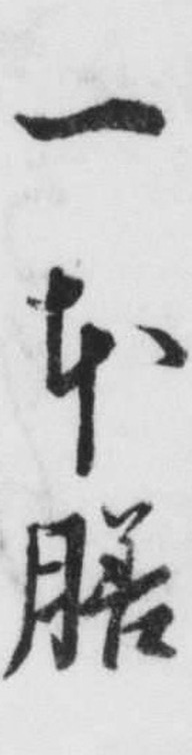一本膳
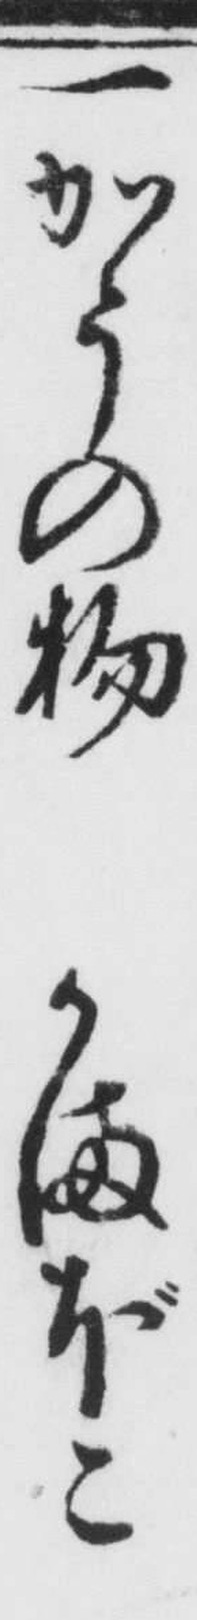一かうの物かまぼこ
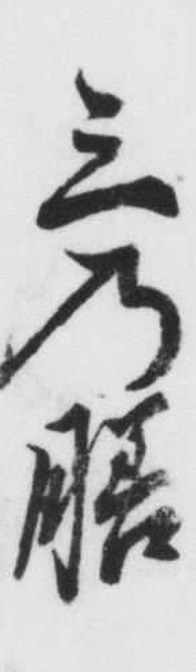三乃膳
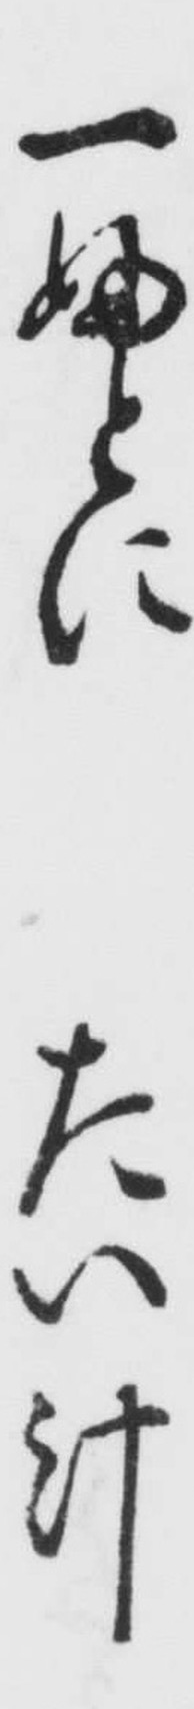一ふとにたい汁
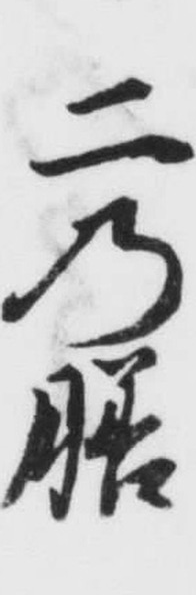二乃膳
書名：料理切形秘伝抄
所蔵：大阪府立大学学術情報センター 国文学研究資料館
